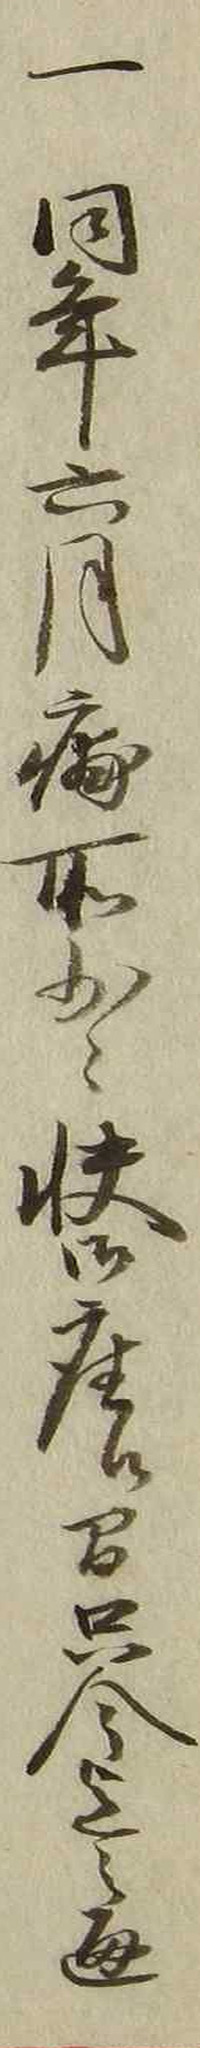一同年六月痛所少々快御座候間只今迄之通
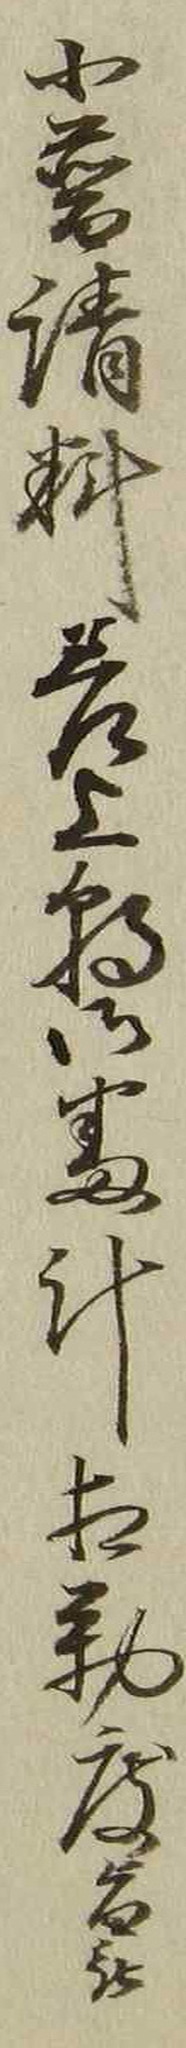小普請料差上朝御番斗相勤度旨被
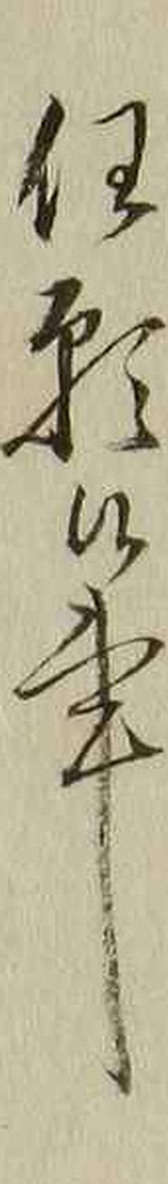伺願候事
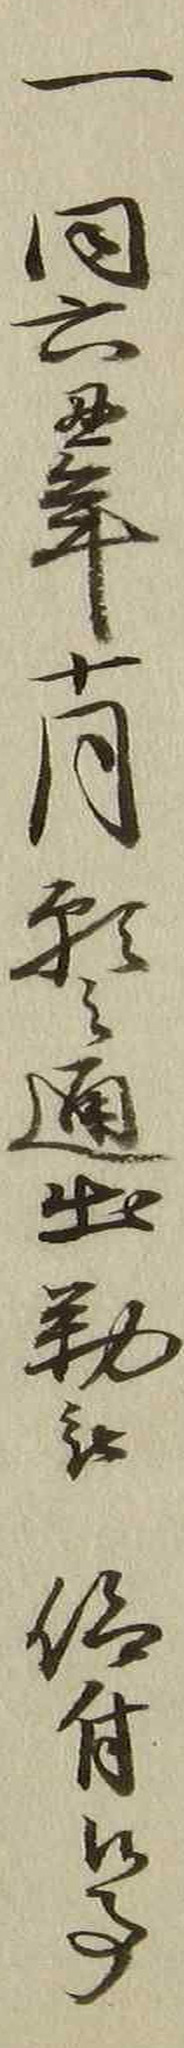一同六丑年十月願之通出勤被仰付候事
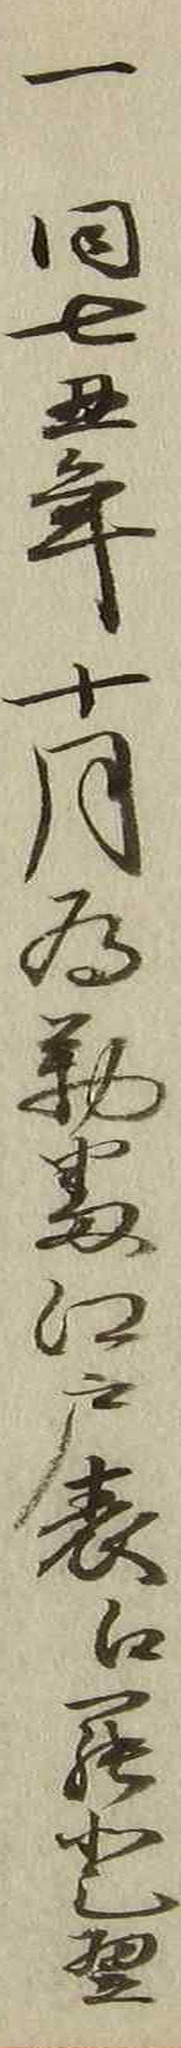一同七丑年十月為勤番江戸表江罷登翌
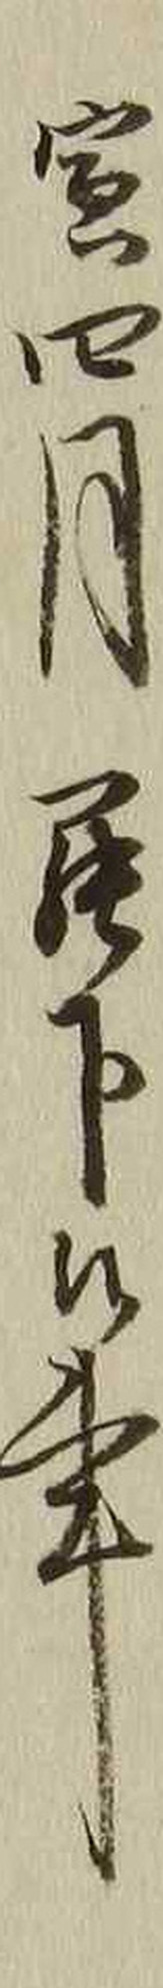寅四月罷下候事
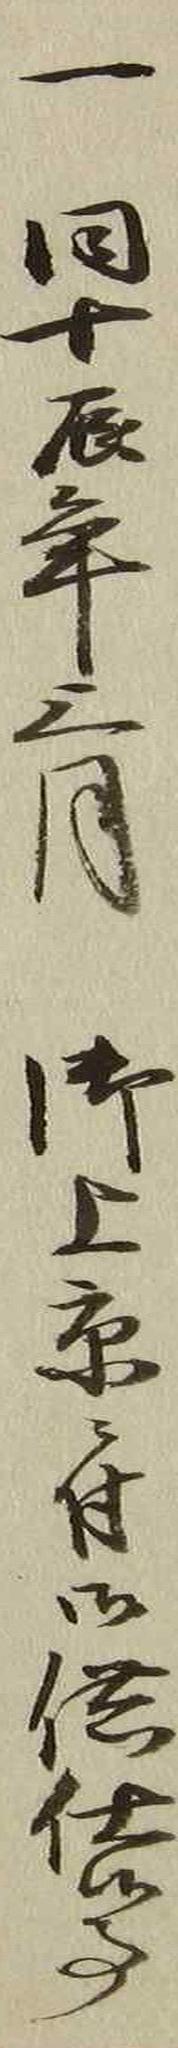一同十辰年三月御上京二付御供仕候事
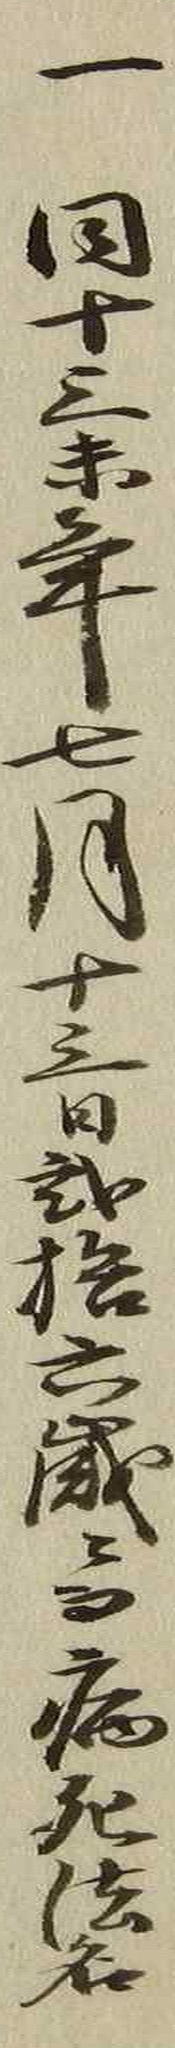一同十三未年七月十三日弐拾六歳ニ而病死法名
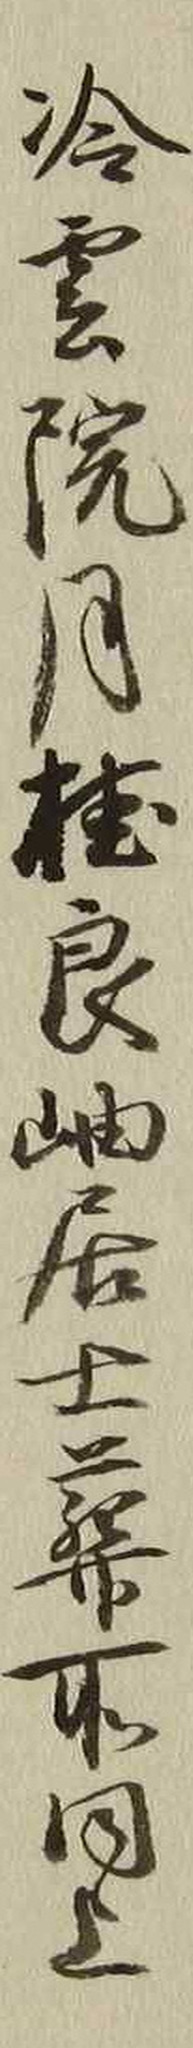冷雲院月桂良岫居士葬所同上
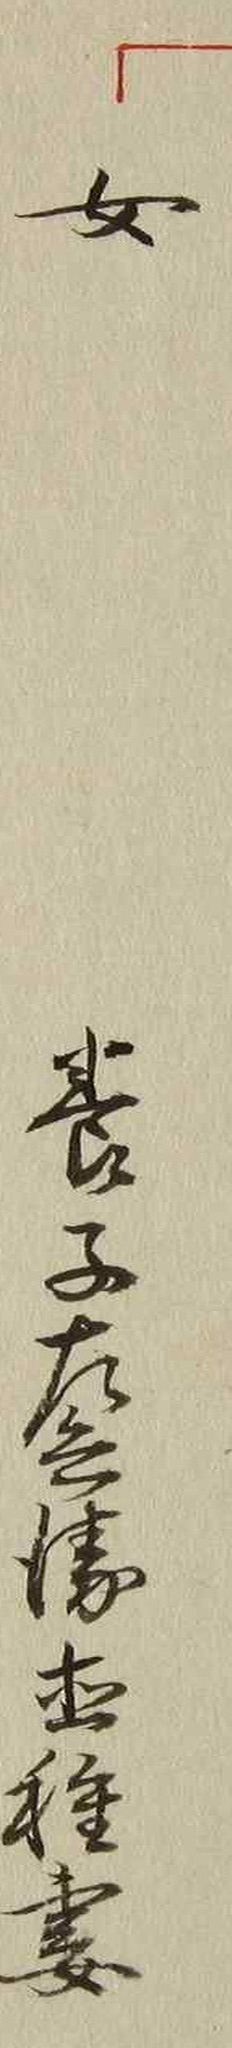女養子左兵衛直種妻
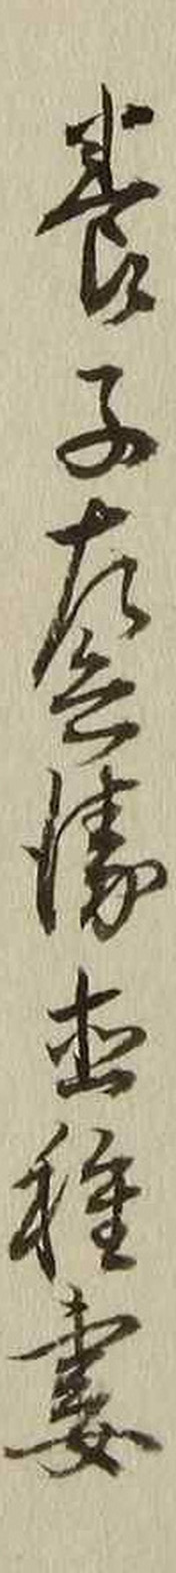女養子左兵衛直種妻
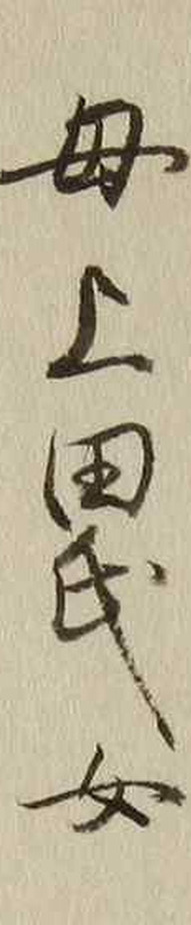母上田氏女
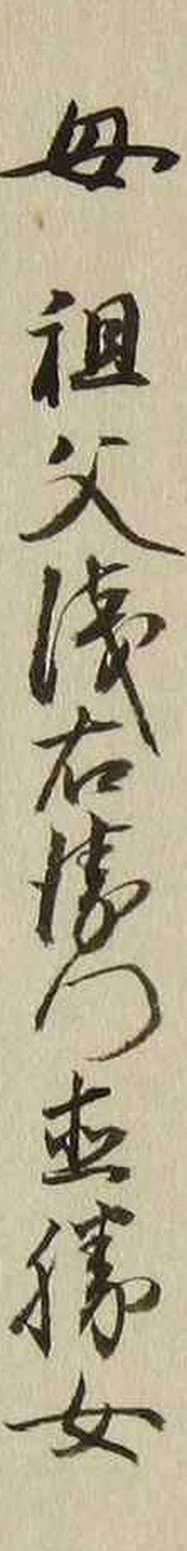母祖父浅右衛門直勝女
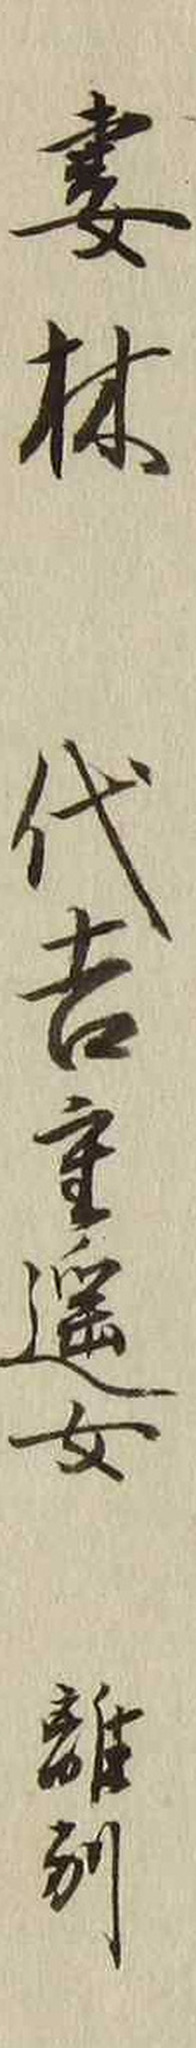妻林代吉重遥女離別
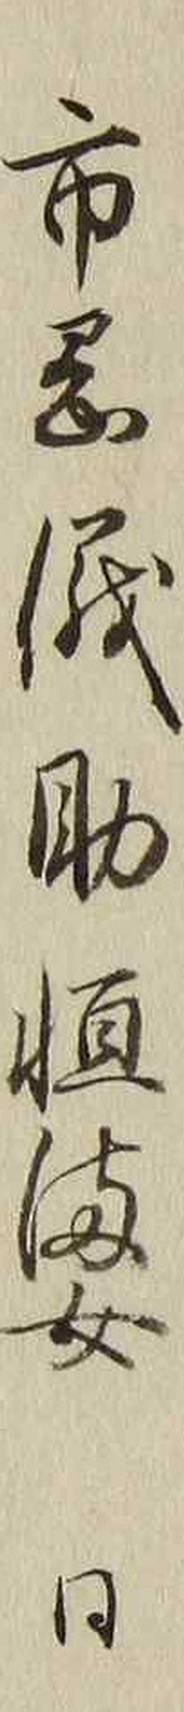市岡儀助恒満女同
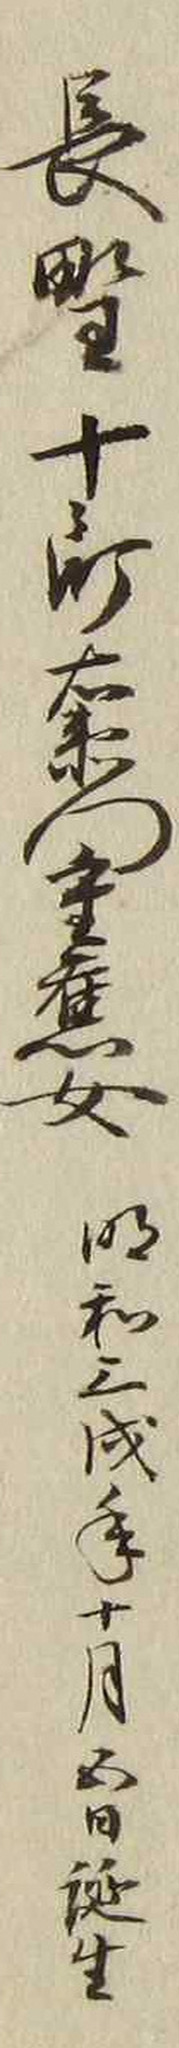長野十郎右衛門重應女明和三戌年十月五日誕生
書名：諸士系譜　巻之114　か之部22
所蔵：会津若松市立会津図書館
